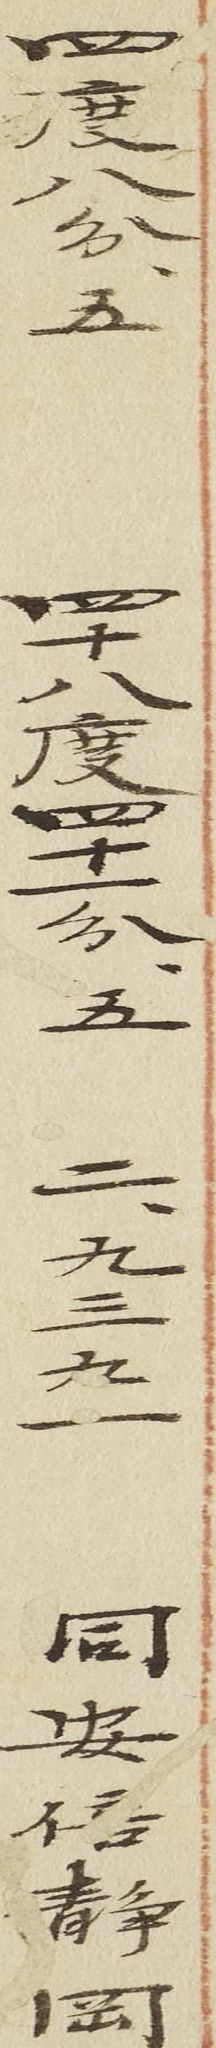四度八分、五四十八度四十一分、五二、九三九一同安倍静岡
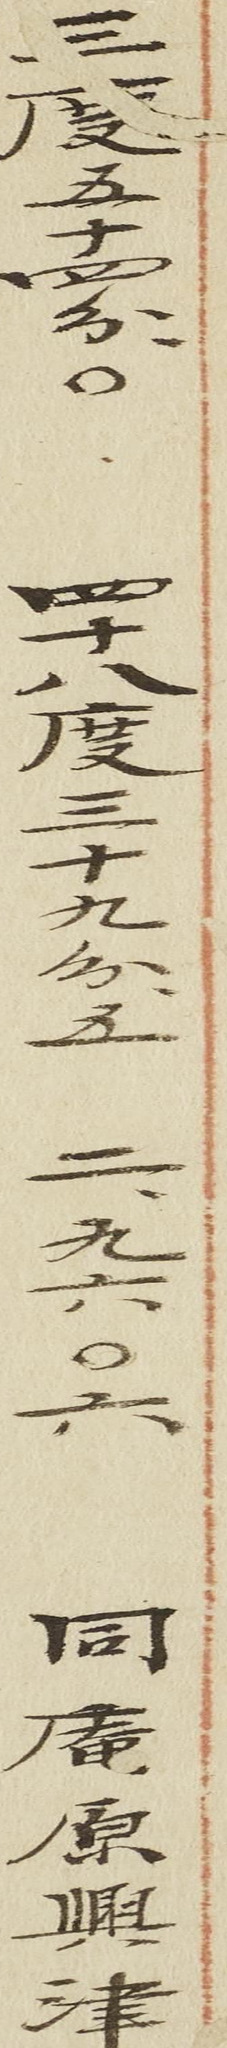三度五十四分、〇四十八度三十九分、五二、九六〇六同庵原興津
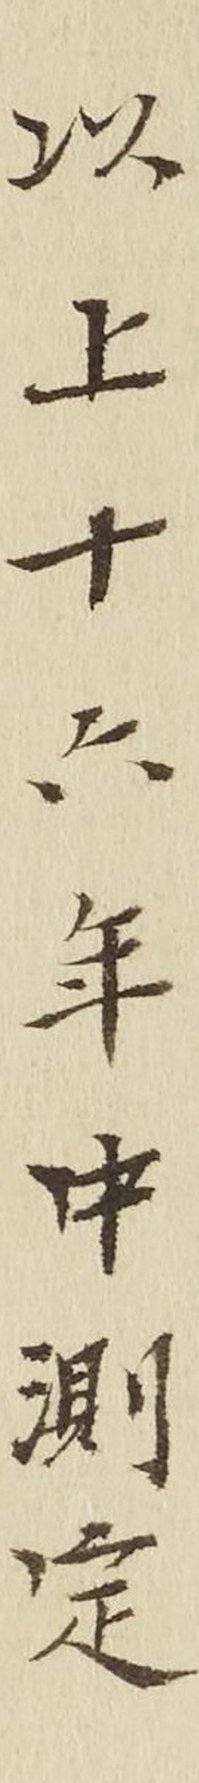以上十六年中測定
